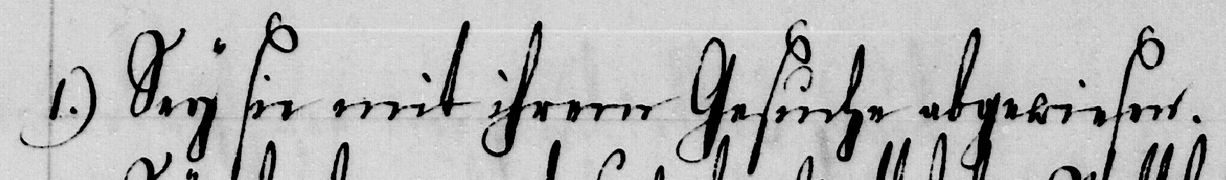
1.) Sey sie mit ihrem Gesuche abgewiesen.
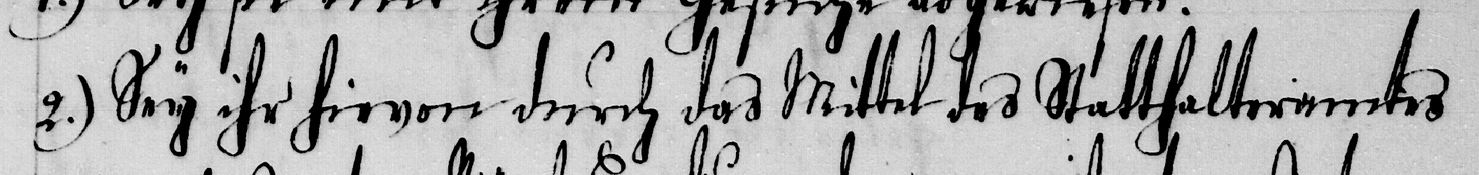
2.) Sey ihr hievon durch das Mittel des Statthalteramtes
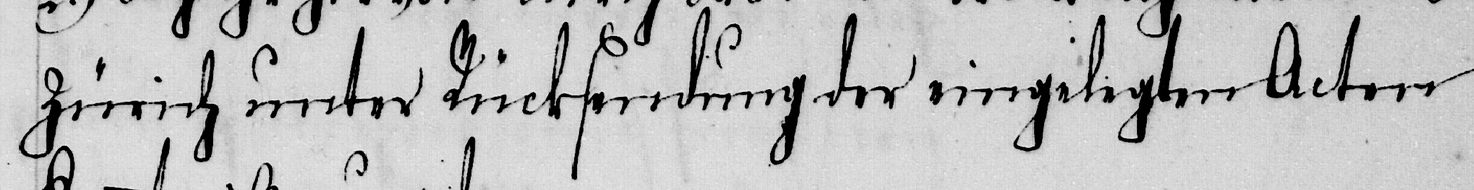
Zürich unter Rücksendung der eingelegten Acten
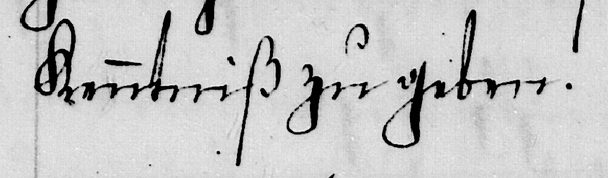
Kenntniß zu geben.
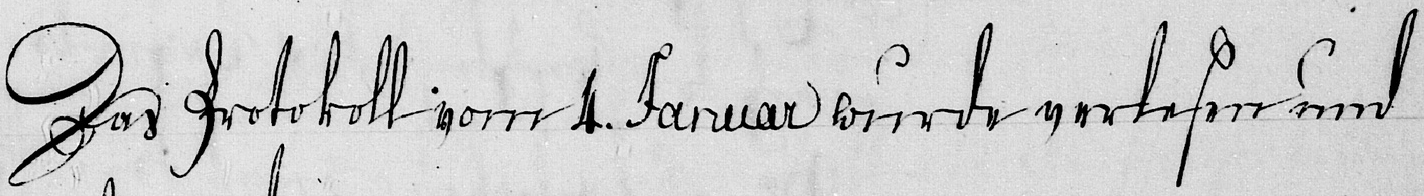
Das Protokoll vom 4. Januar wurde verlesen und
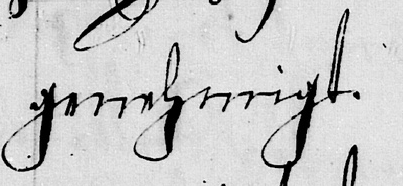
genehmigt.
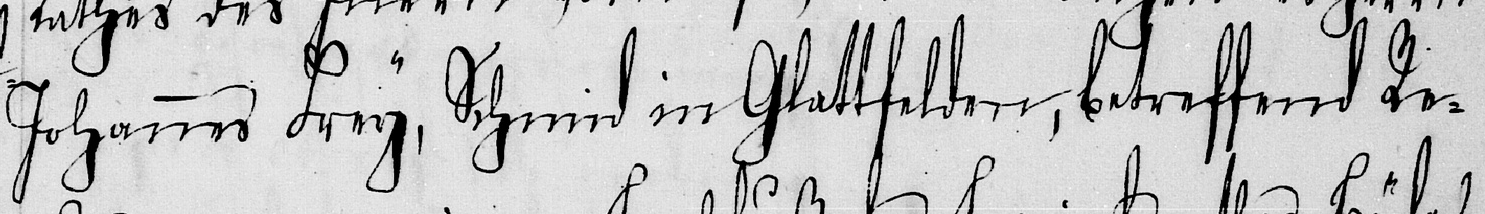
Johannes Frey, Schmid in Glattfelden, betreffend Re¬
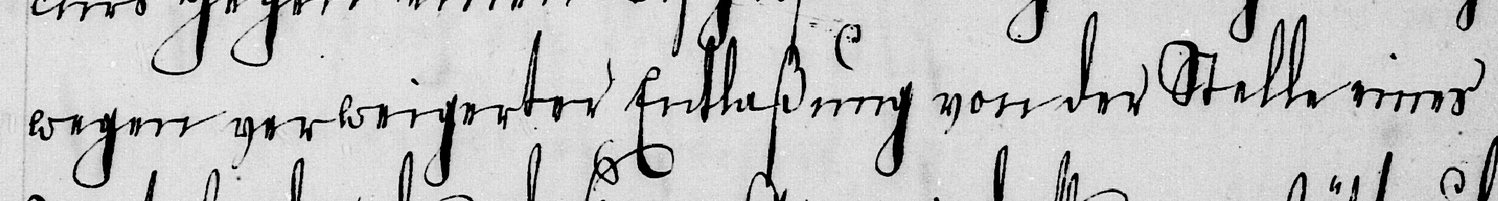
wegen verweigerter Entlaßung von der Stelle eines
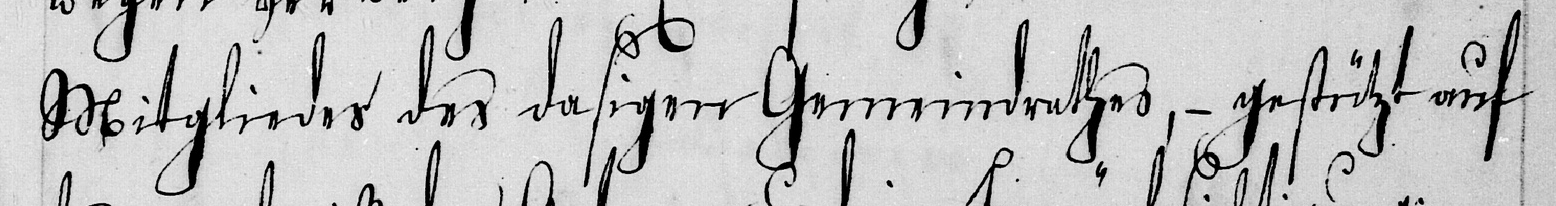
Mitgliedes des dasigen Gemeindrathes, – gestützt auf
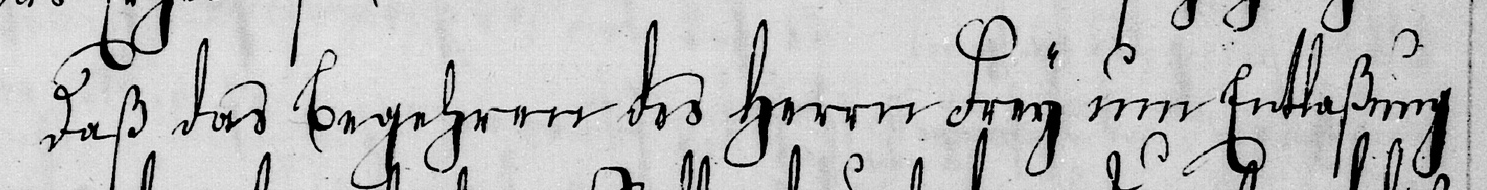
Daß das Begehren des Herrn Frey um Entlaßung
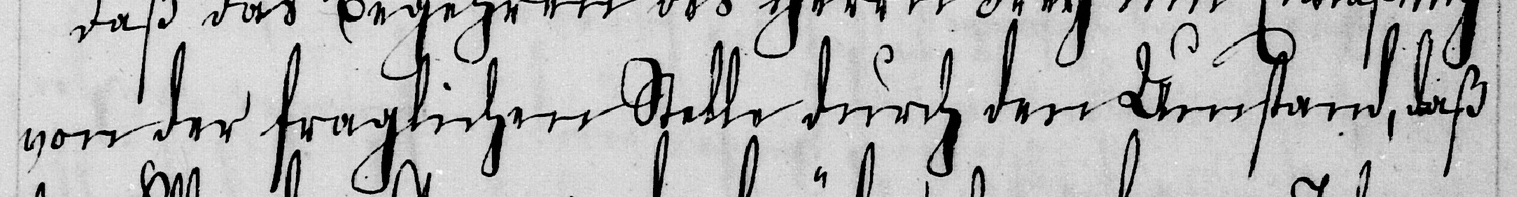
von der fraglichen Stelle durch den Umstand, daß
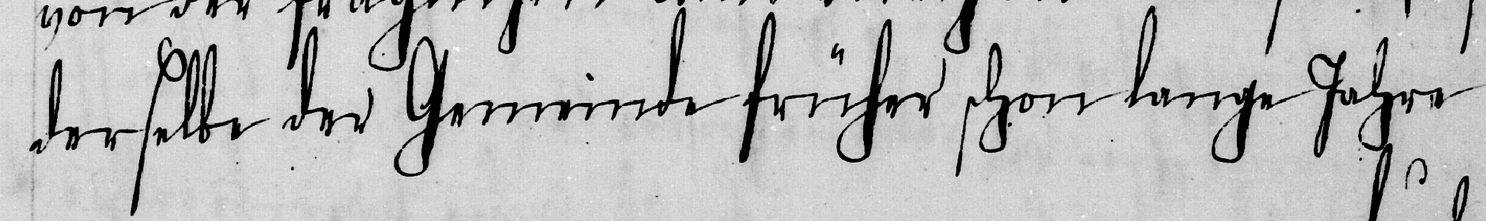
derselbe der Gemeinde früher schon lange Jahre
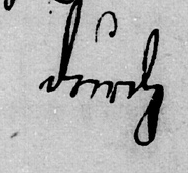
odurch
